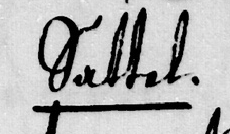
Sattel.
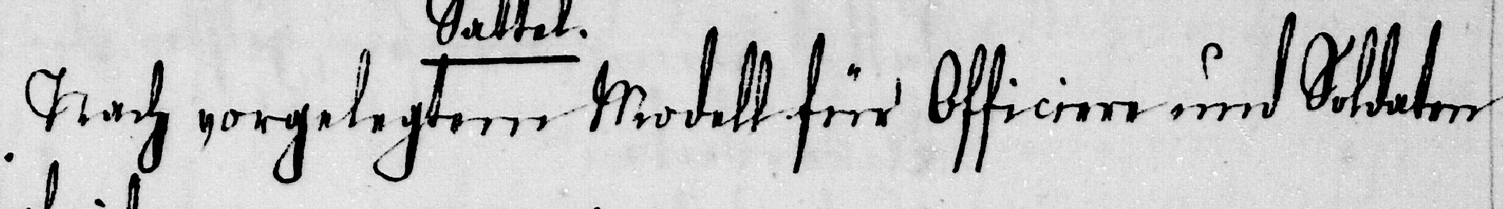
Nach vorgelegtem Modell für Officiere und Soldaten
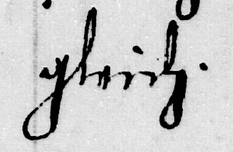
gleich.
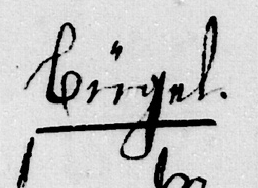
Bügel.
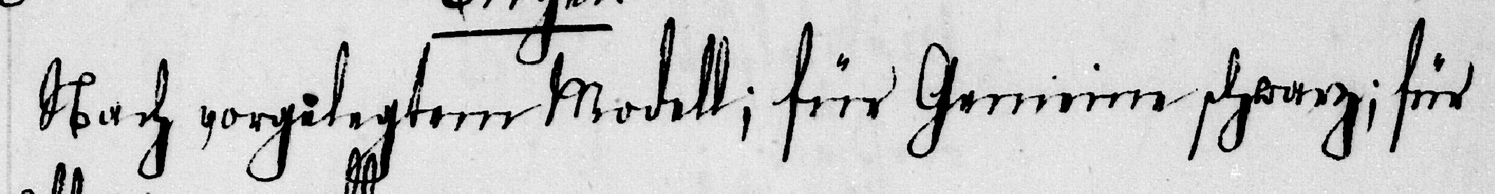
Nach vorgelegtem Modell; für Gemeine schwarz; für
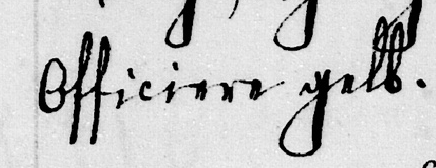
Officiere gelb.
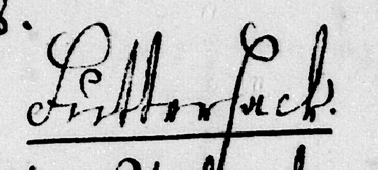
Futtersack.
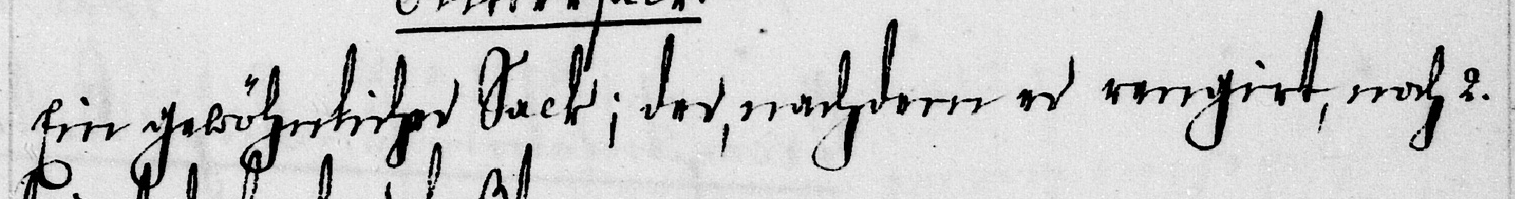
Ein gewöhnlicher Sack; der, nachdem er rengirt, noch 2.
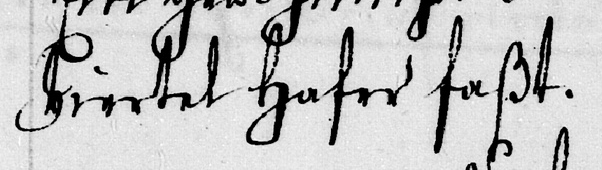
Viertel Hafer faßt.
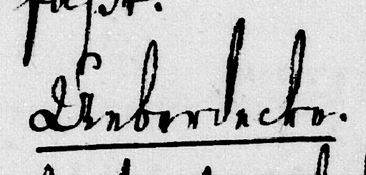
Ueberdecke.
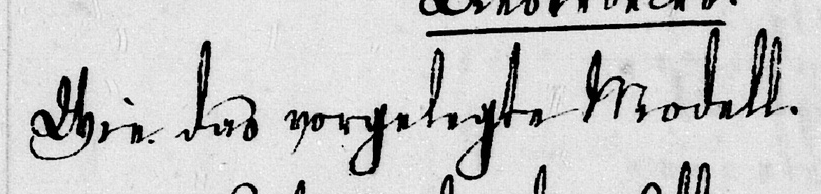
Wie das vorgelegte Modell.
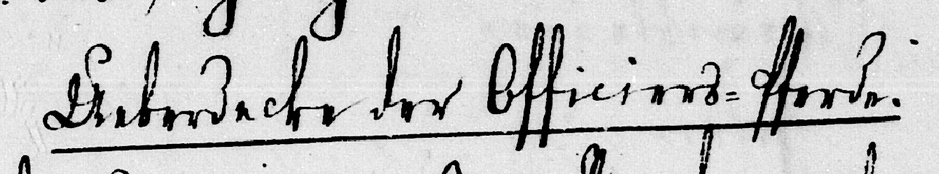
Ueberdecke der Officiers-Pferde.
